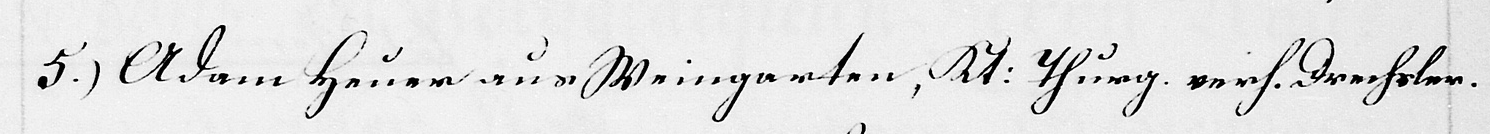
5.) Adam Heuer aus Weingarten, Kt: Thurg. verh. Drechsler.
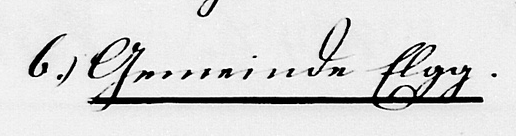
b.) Gemeinde Elgg.
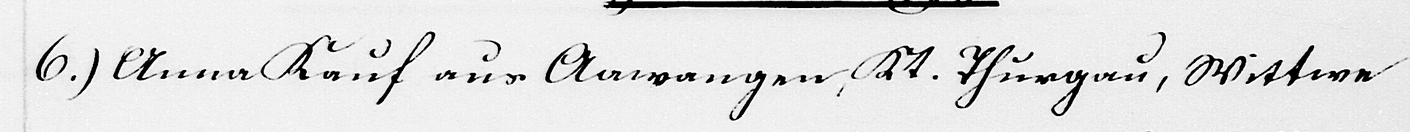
6.) Anna Kauf aus Aawangen, Kt. Thrugau, Wittwe
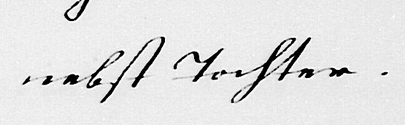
nebst Tochter.
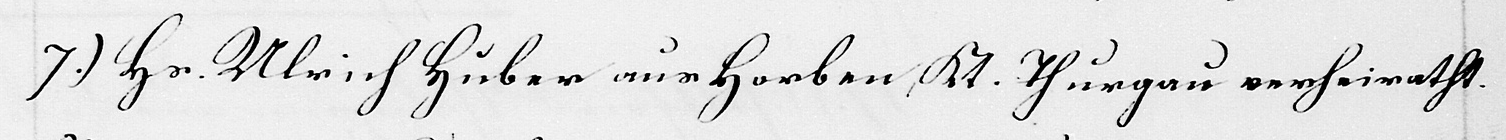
7.) Hs. Ulrich Huber aus Horben, Kt. Thurgau verheiratht.
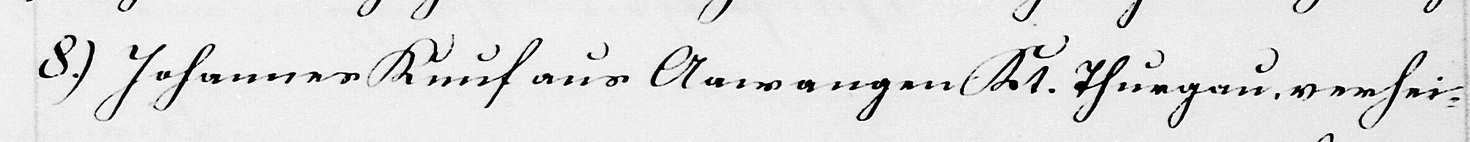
8.) Johannes Knuf aus Aawangen Kt. Thurgau, verhei¬
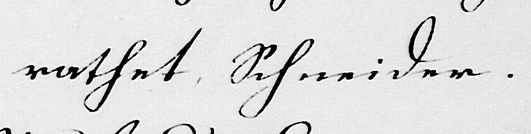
rathet, Schneider.
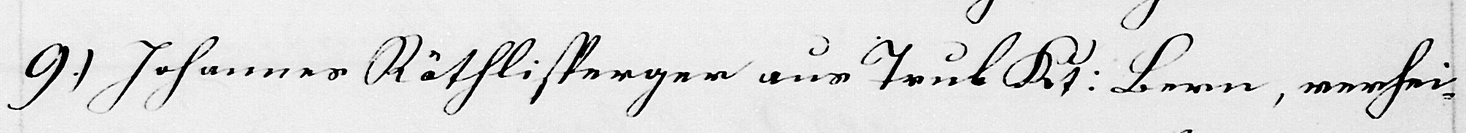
9.) Johannes Röthlisperger aus Trub Kt: Bern, verhei¬
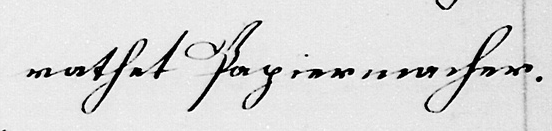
rathet Papiermacher.
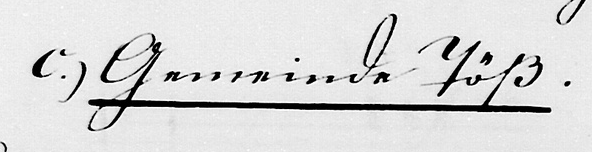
c.) Gemeinde Töß.
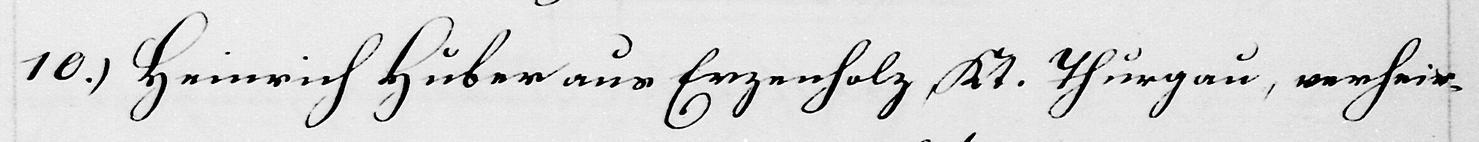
10.) Heinrich Huber aus Erzenholz, Kt. Thurgau, verhei¬
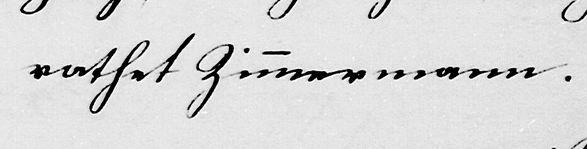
rathet Zimmermann.
